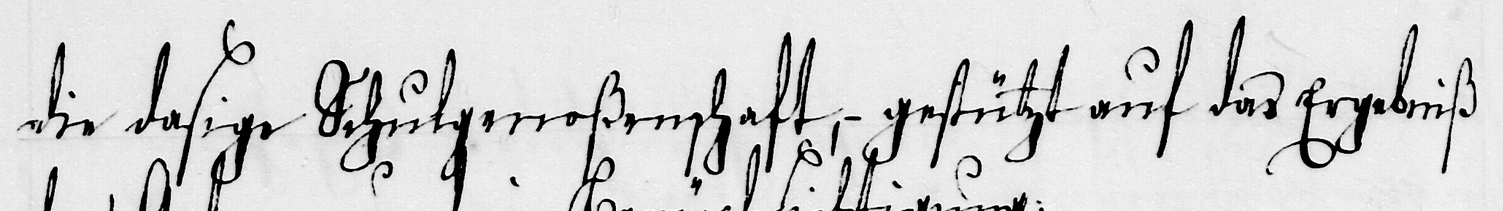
die dasige Schulgenoßenschaft, – gestützt auf das Ergebniß
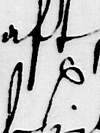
1.)
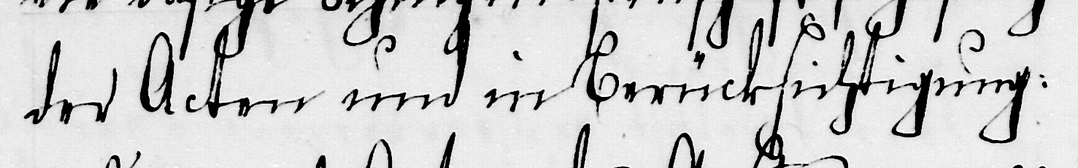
der Acten und in Berücksichtigung:
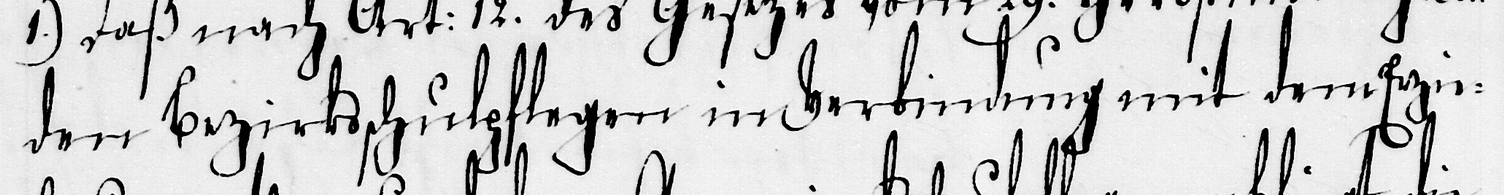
den Bezirksschulpflegen in Verbindung mit dem Erzie¬
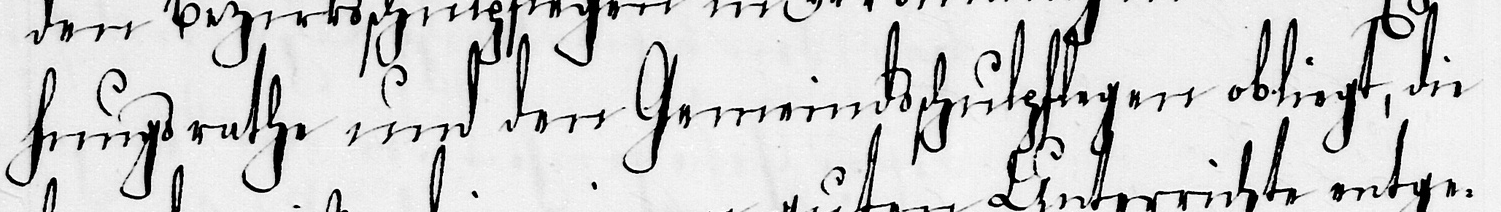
hungsrathe und den Gemeindsschulpflegen obliegt, die
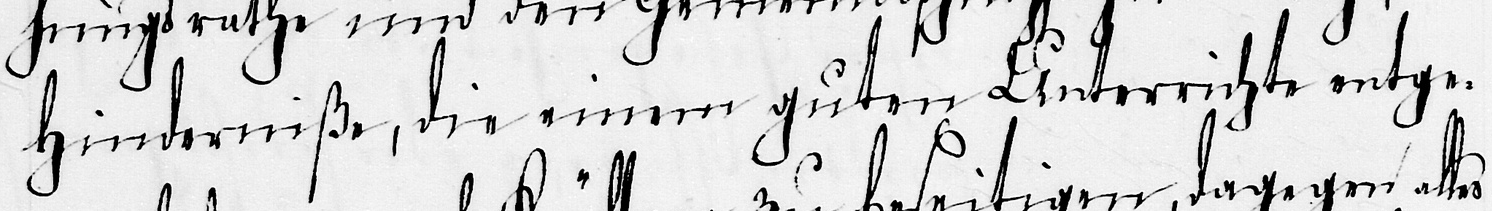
Hinderniße, die einem guten Unterrichte entge¬
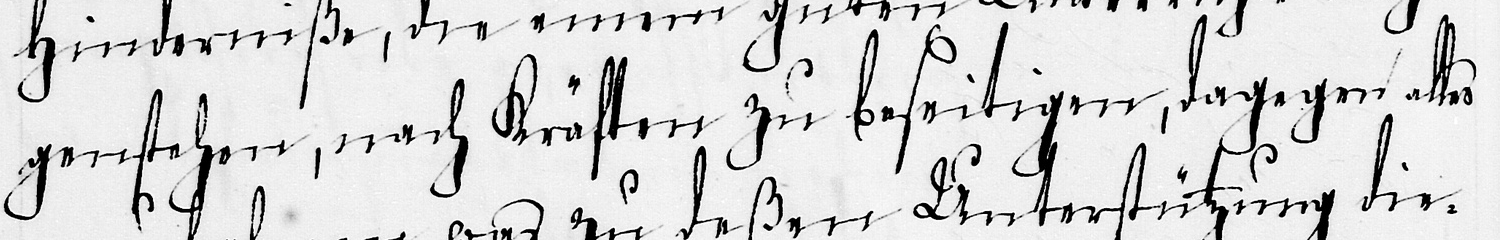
genstehen, nach Kräften zu beseitigen, dagegen al¬
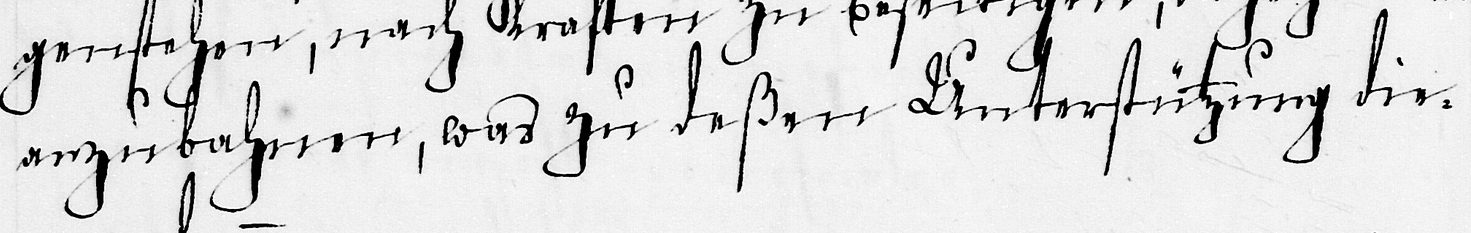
anzubahnen, was zu deßen Unterstützung die¬
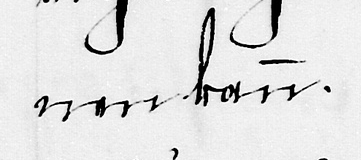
nen kann.
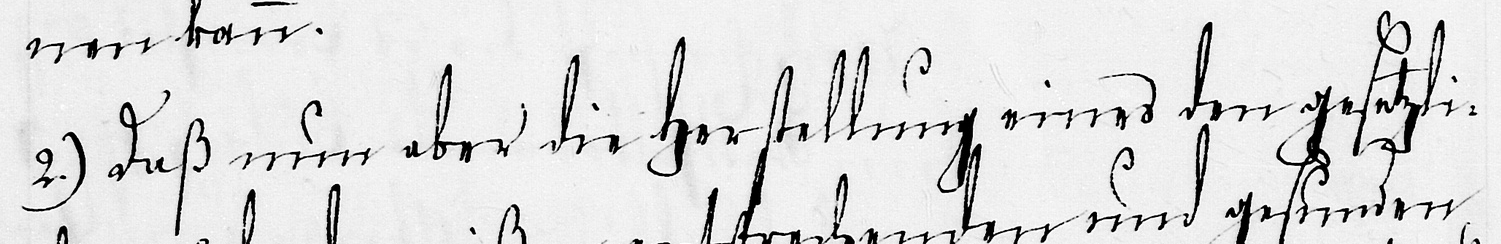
2.) Daß nun aber die Herstellung eines den gesetzli¬
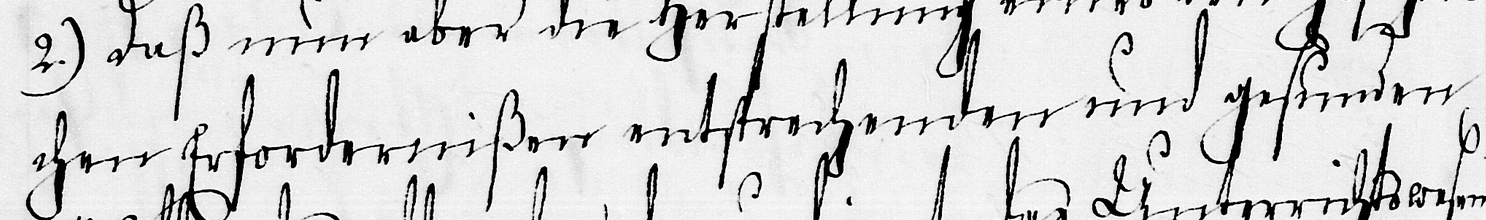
chen Erfordernißen entsprechenden und gesunden
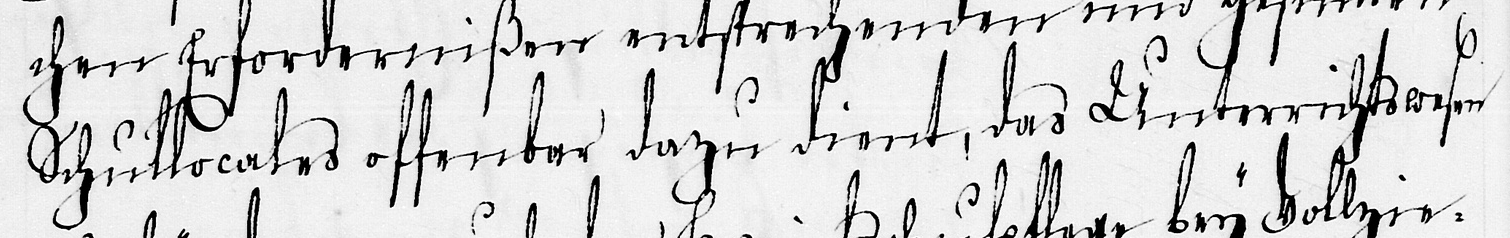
Schullocales offenbar dazu dient, das Unterrichtswesen
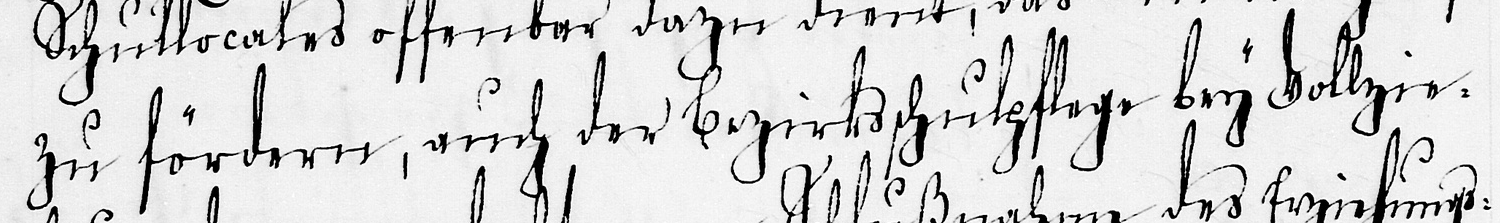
zu fördern, auch der Bezirksschulpflege bey Vollzie¬
